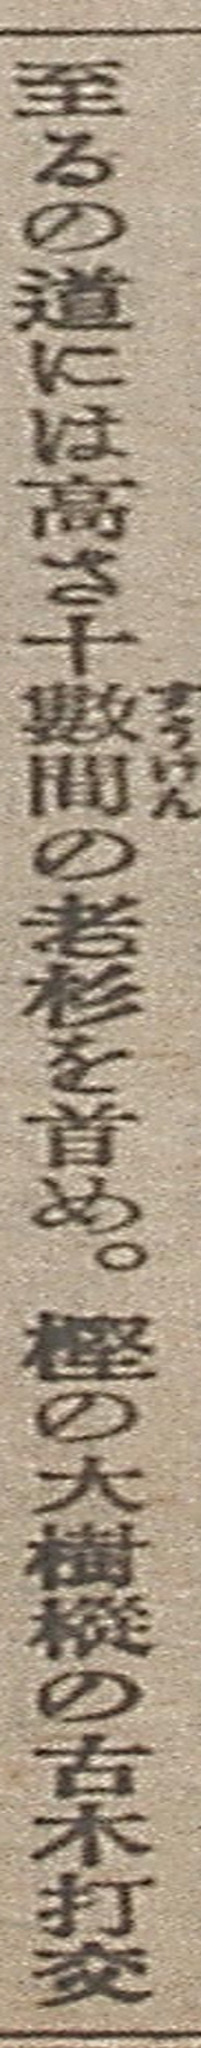至るの道には高さ十数間の老杉を首め。樫の大樹樅の古木打変
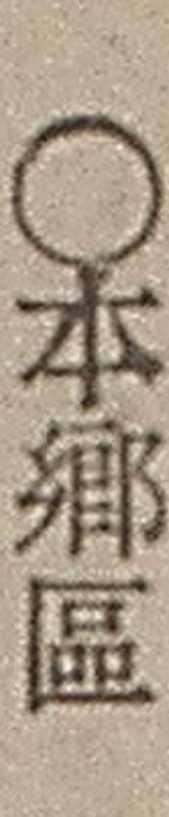〇本郷区
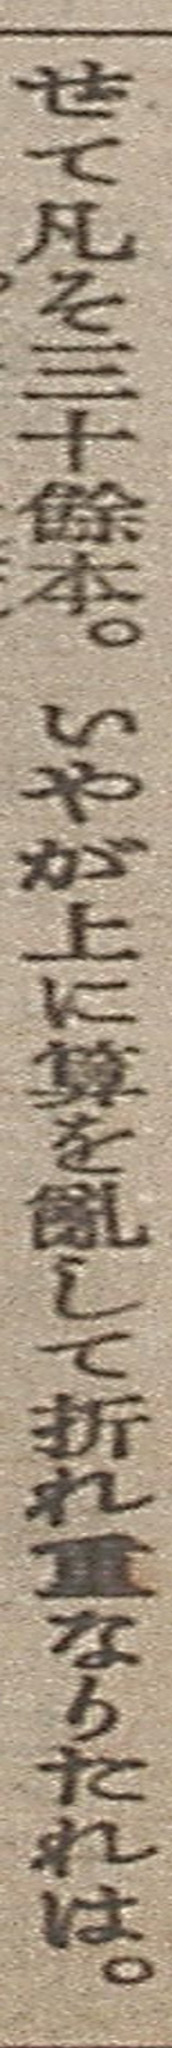ぜて凡そ三十余本。いやが上に算を乱して折れ重なりたれは。
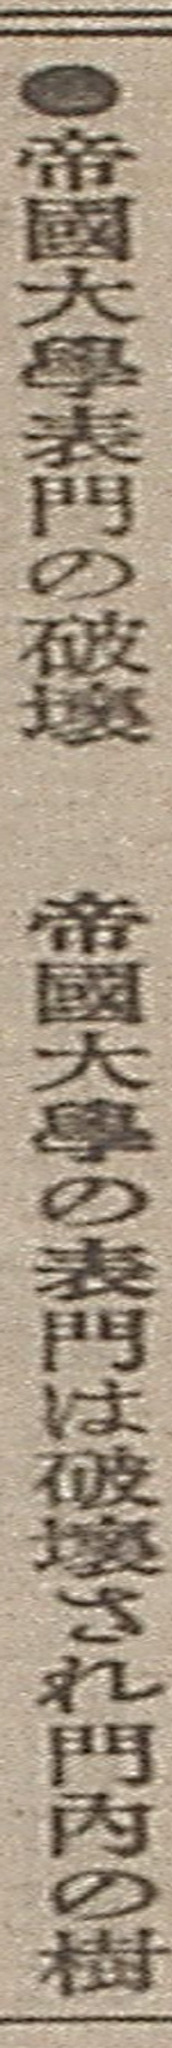●帝国大学表門の破壊帝国大学の表門は破壊され門内の樹
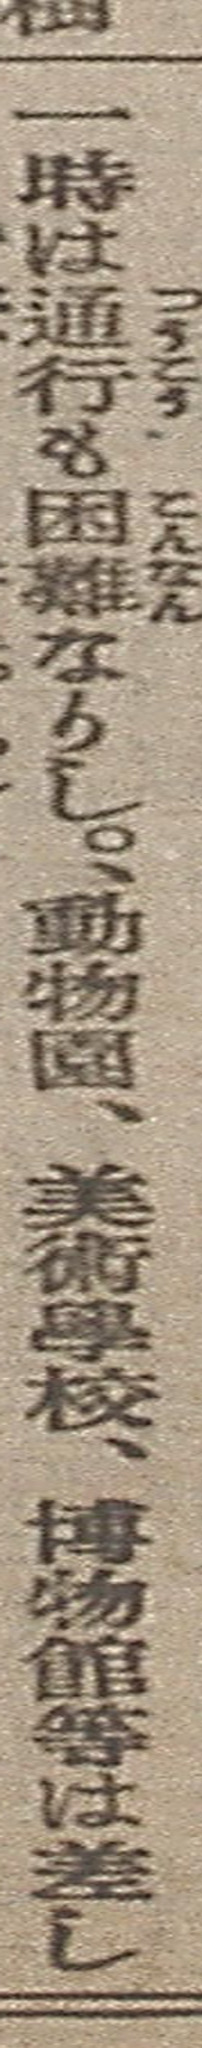一時は通行も困難なりし。動物園、美術学校、博物館等は差し
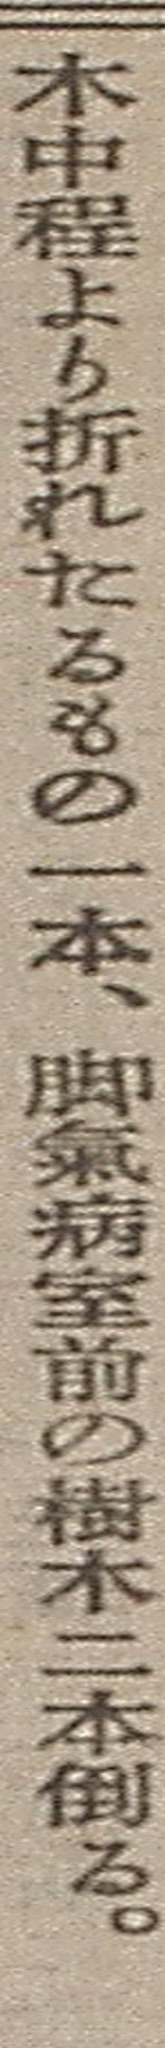木中程より折れたるもの一本、脚気病室前の樹木二本倒る。
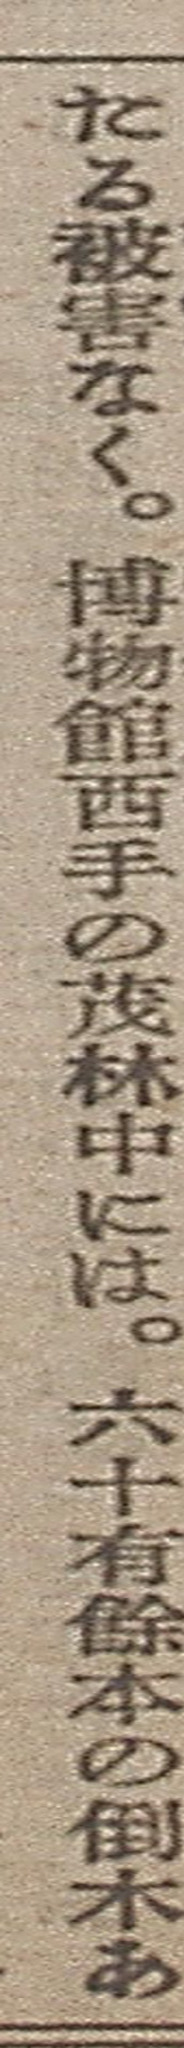たる被害なく。博物館西手の茂林中には。六十有余本の倒木あ
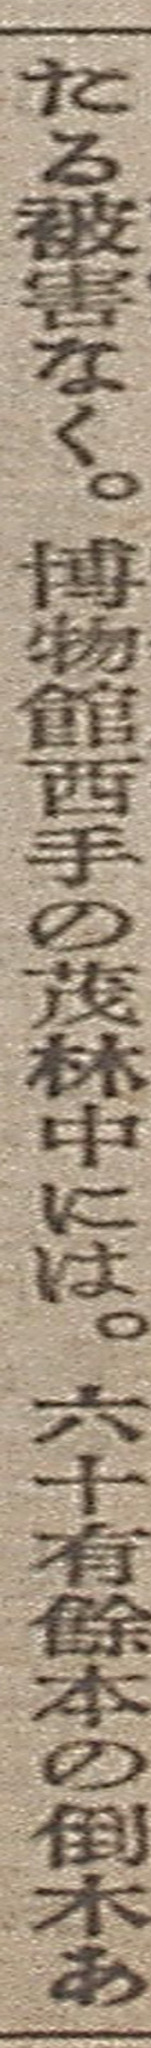たる被害なく。博物館西手の茂林中には。六十有余本の倒木あ
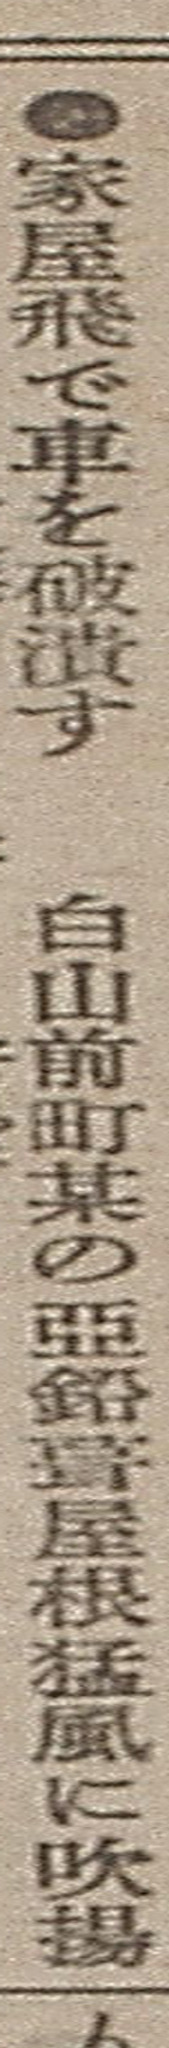●家屋飛で車を破潰す白山町某の亜鉛葺屋根猛風に吹揚
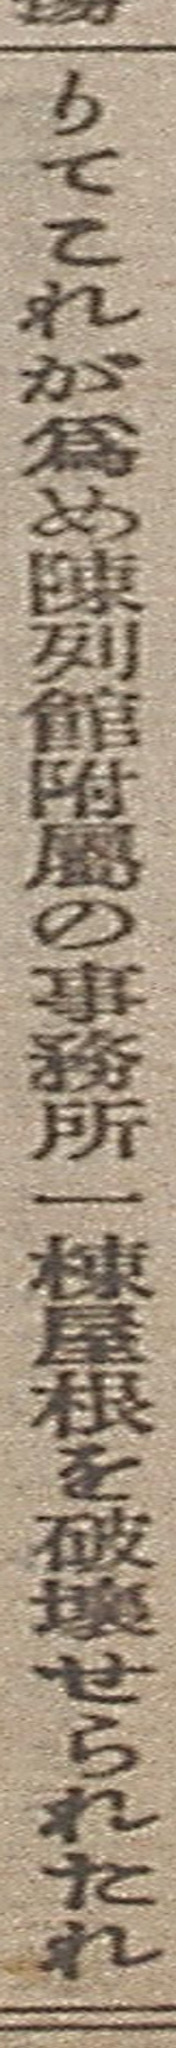りてこれが為め陳列館附属の事務所一棟屋根を破壊せられたれ
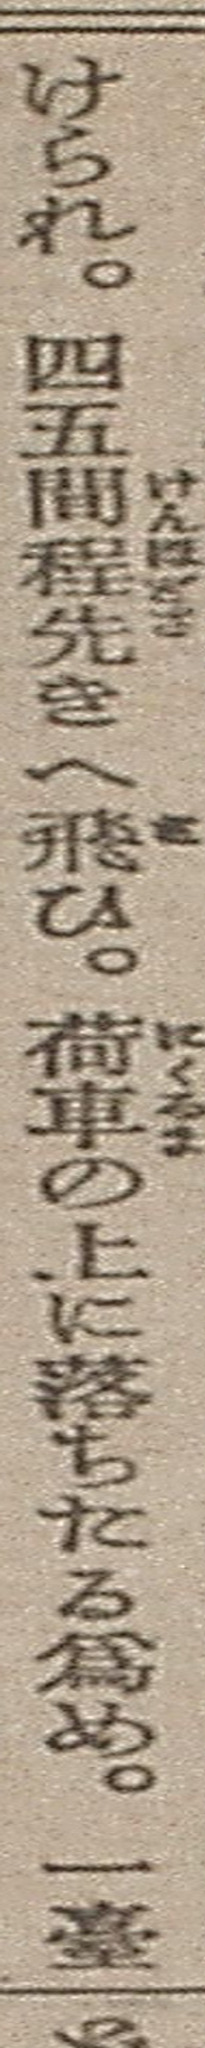けられ。四五間程先きへ飛ひ。荷車の上に落ちたる為め。一台
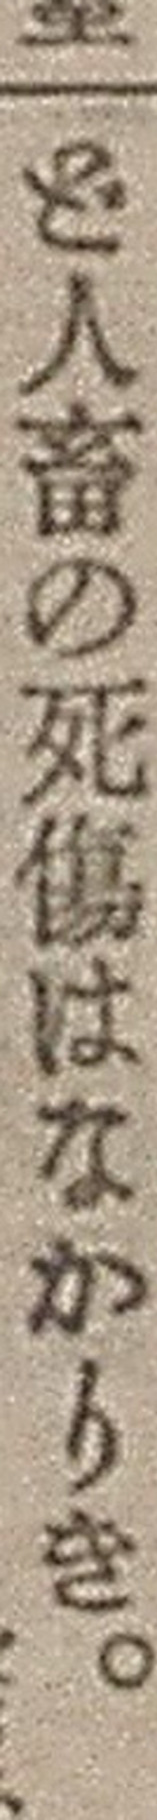ど人畜の死傷はなかりき。
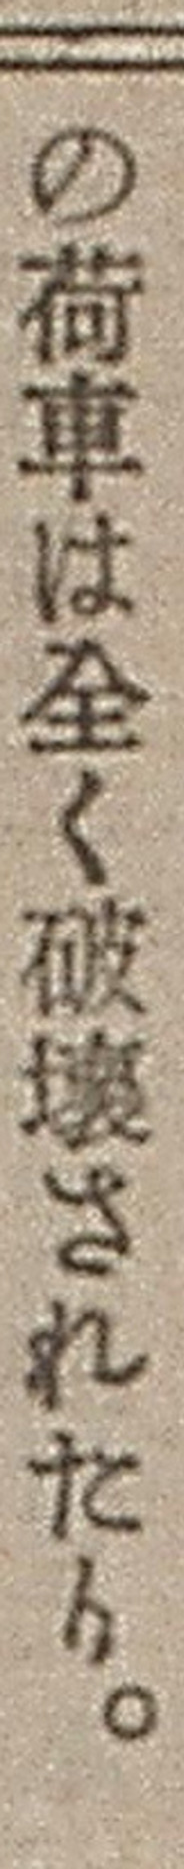の荷車は全く破壊されたり。
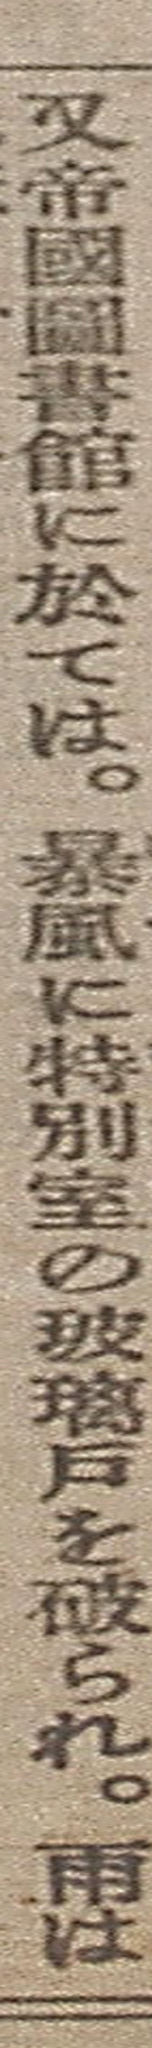又帝国図書館に於ては。暴風に特別室の玻璃戸を破られ。雨は
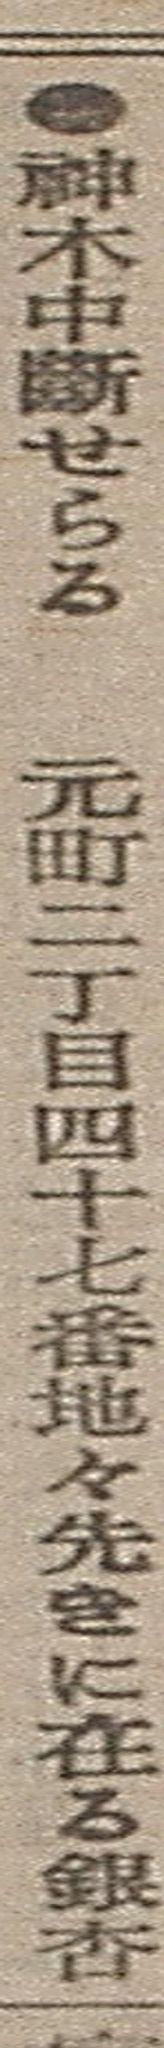●神木中断せらる。元町二丁目四十七番地々先きに在る銀杏
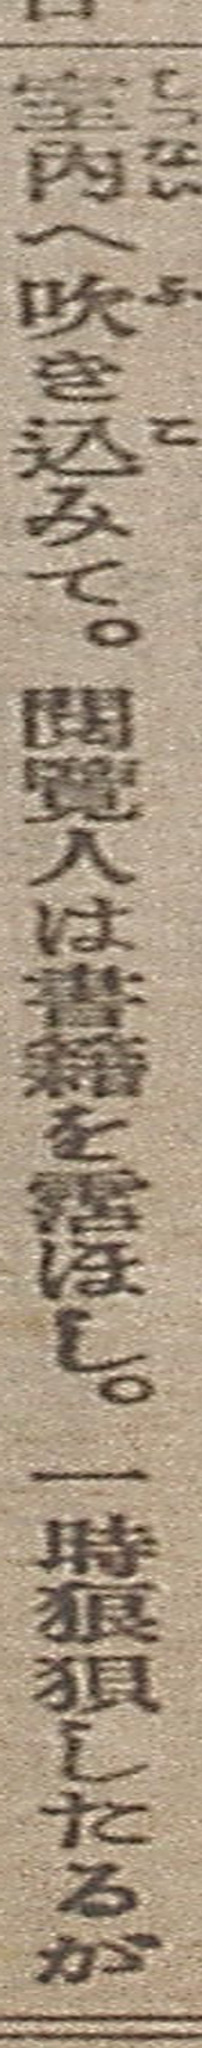室内へ吹き込みて。閲覧人は書籍を霑ほし。一時狼狽したるが
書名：風俗畫報臨時増刊第百九十九號　明治三十二年十月各地災害圖會（前編之續）
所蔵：東京大学地震研究所図書室 Earthquake Research Institute Library, The University of Tokyo, JAPAN
